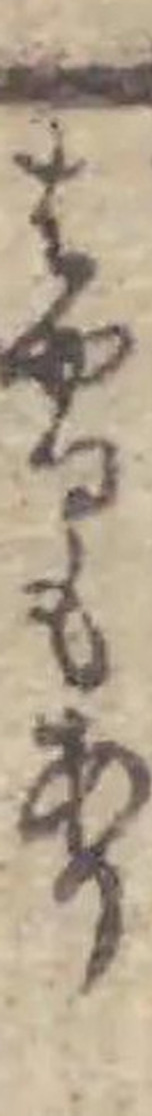はやるもあり
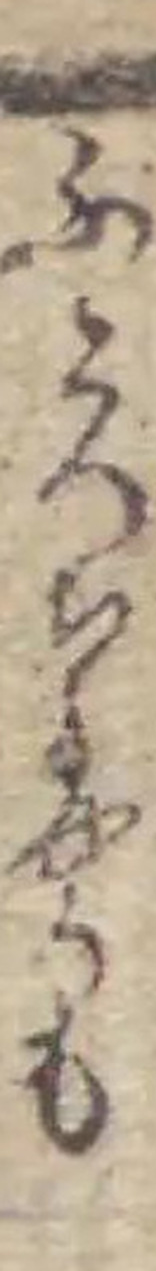ふとつちよやうも
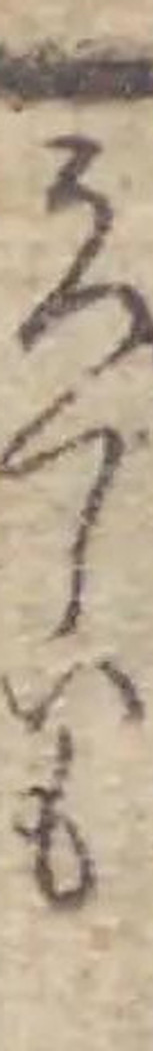うつくしいも
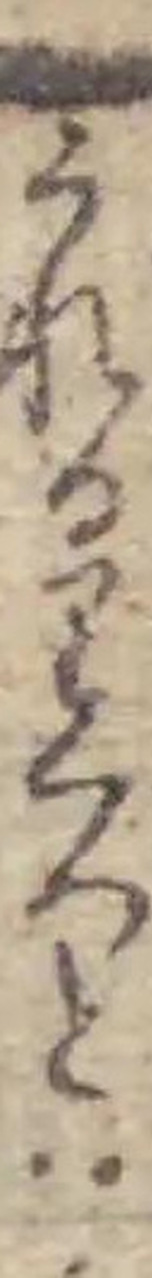うれるりくつと
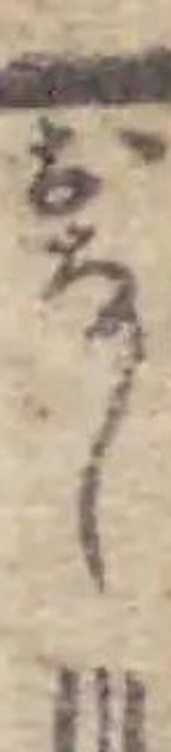おなし
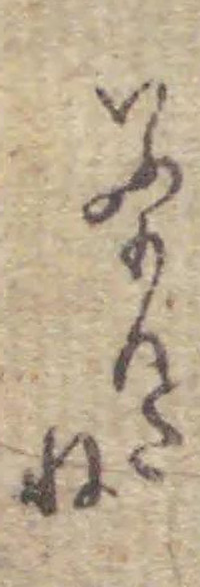いふもんた

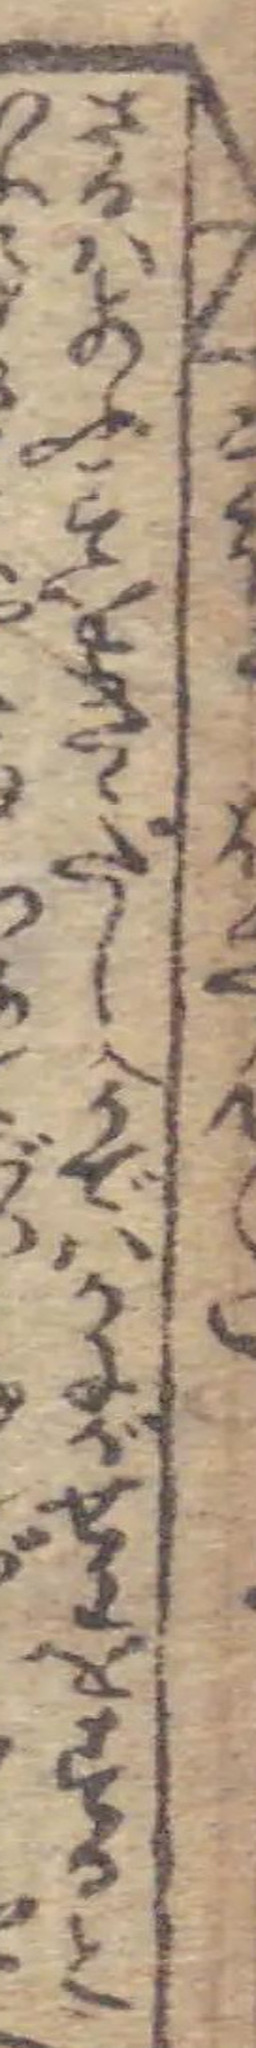さるはよふすをきゝだし今ではかにがせわをすると
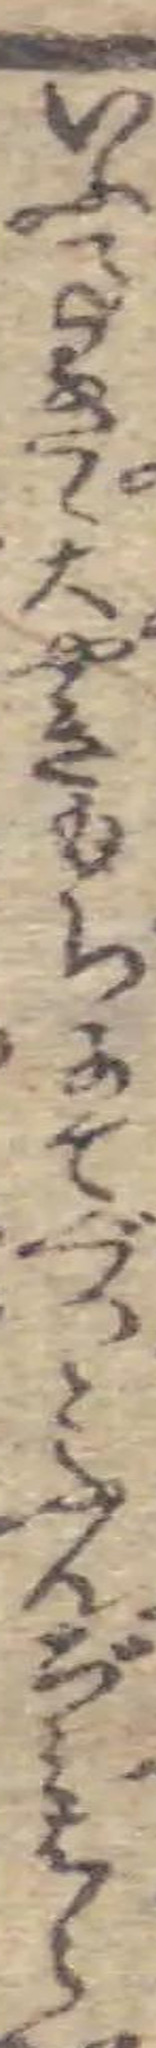いふ事きゝ大やきもちにてぐつとふんごみはらを
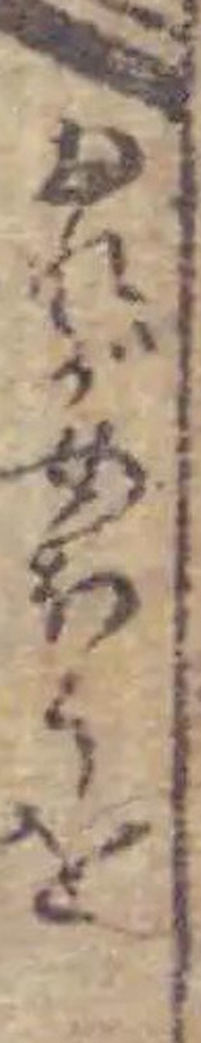おれが女ほうを
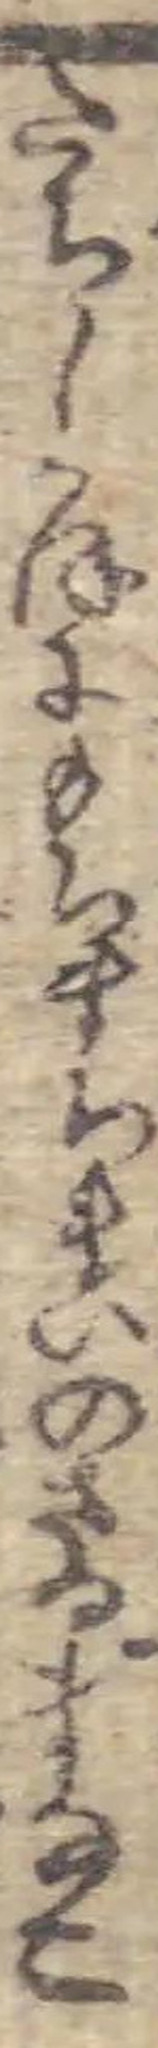たちしかほにもちまちまいのさるまなこ
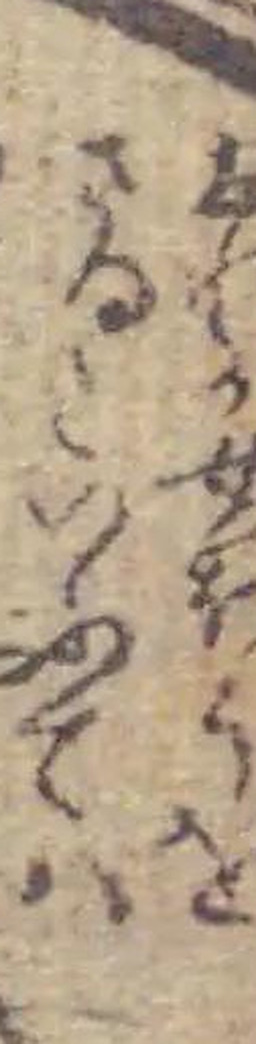さるといふては
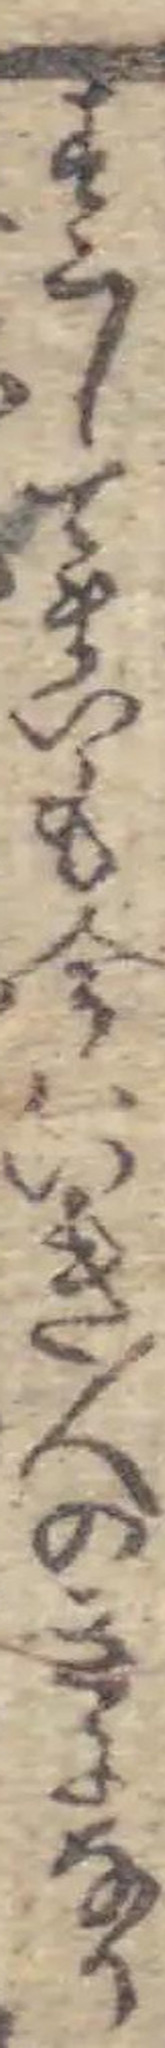すこしてまいも今はいき人のきになり
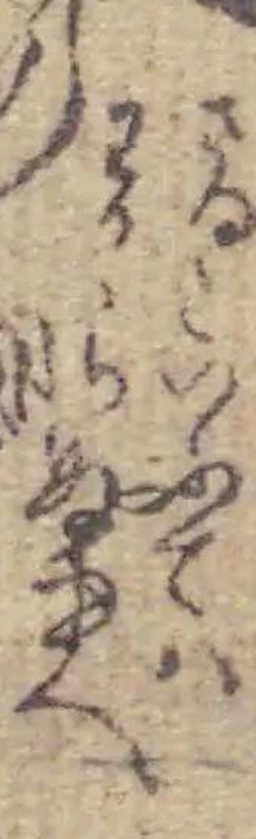わからぬゆへ
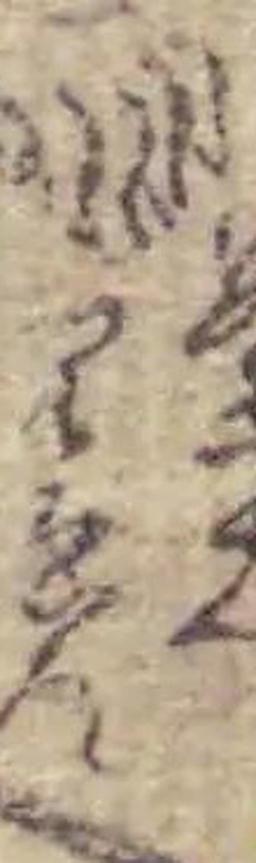りゑん
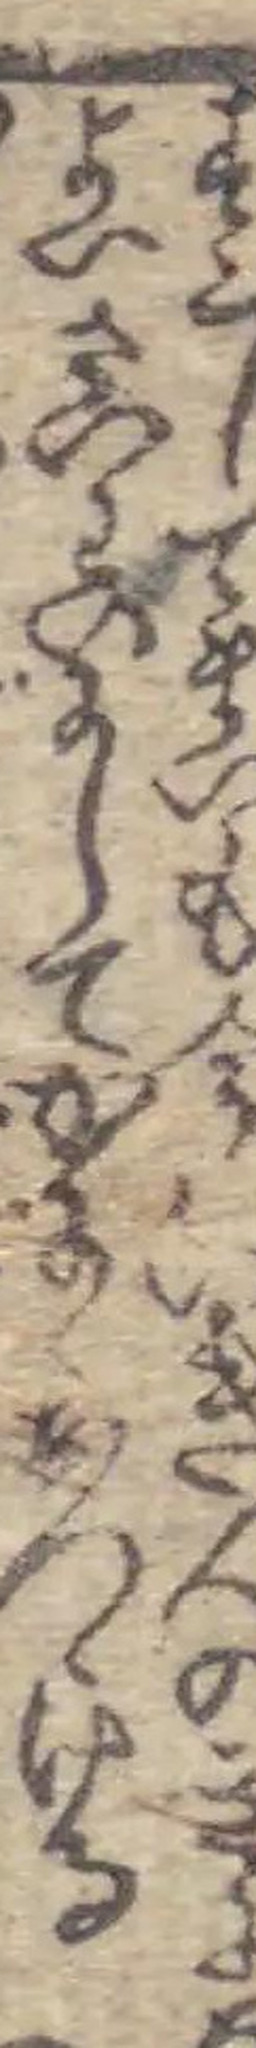よいさいわいにしてかにゝおつゝける
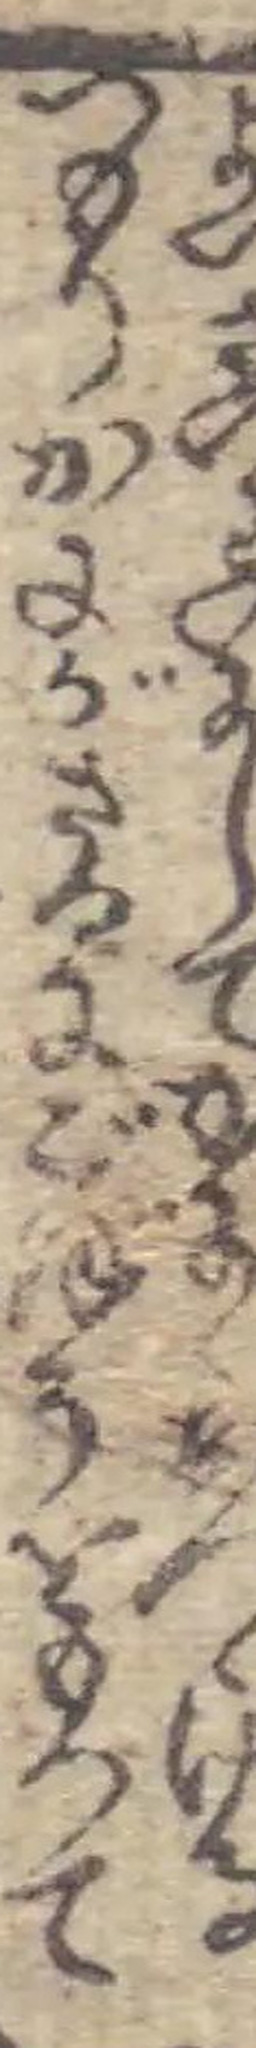つもりかにがさるにごぼうをもつて
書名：蟹牛房挟多 3巻
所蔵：国立国会図書館 National Diet Library, JAPAN
